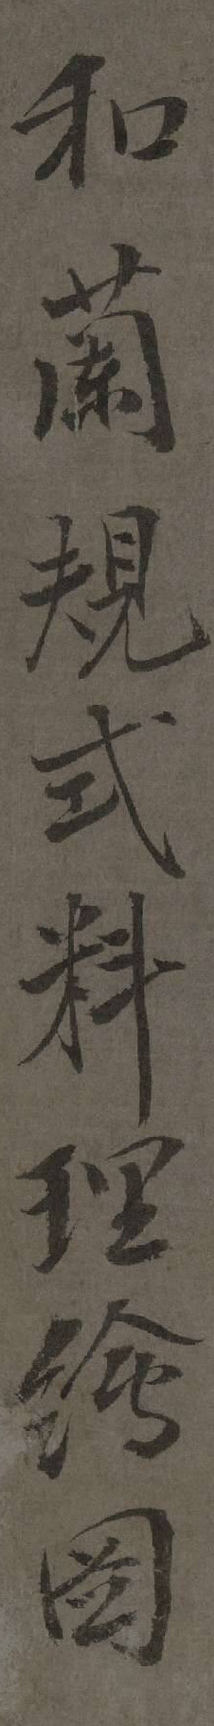和蘭規式料理絵図

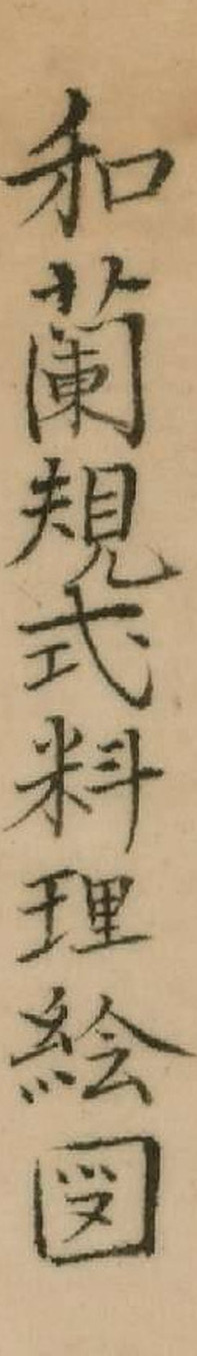和蘭規式料理絵図
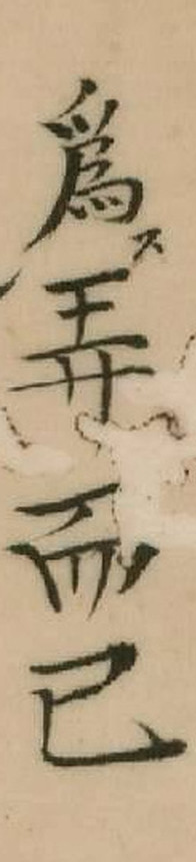為弄而已
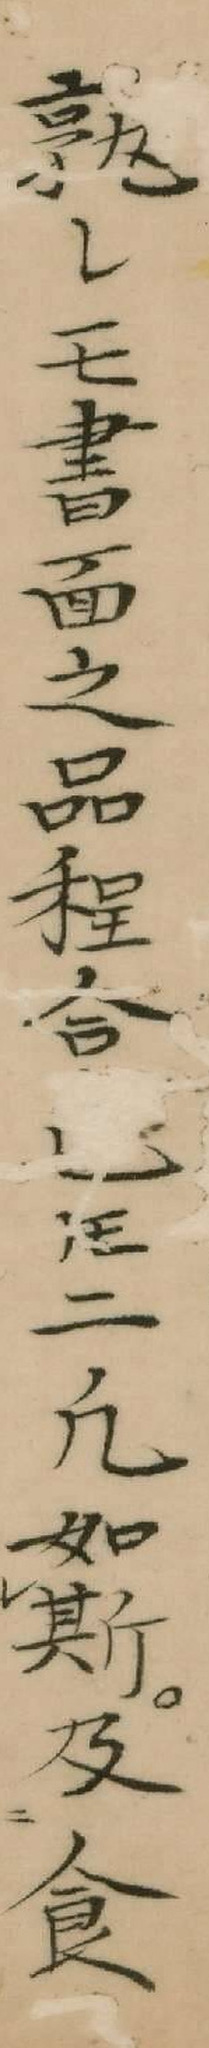孰レモ書面之品程合トモニ凡如斯。及食
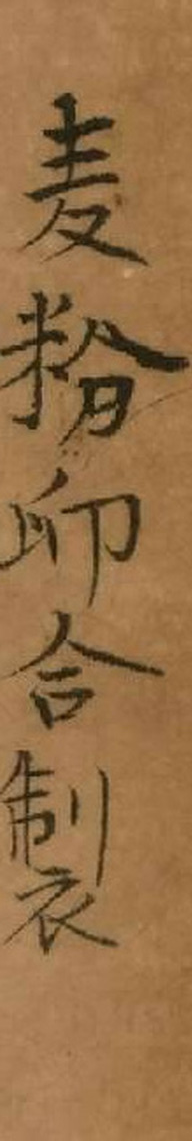麦粉卵合製
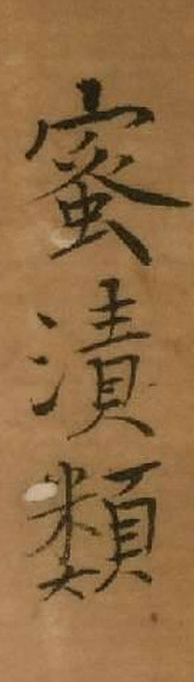蜜漬類
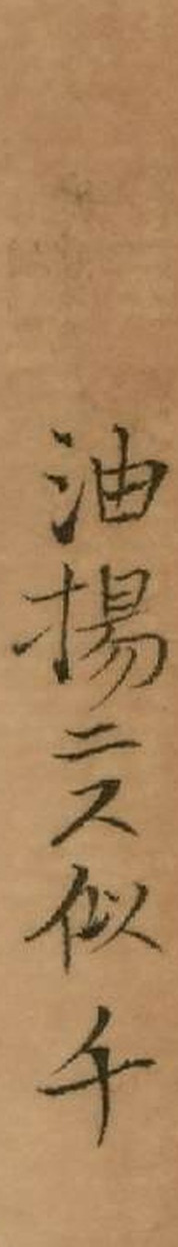油揚ニス似千
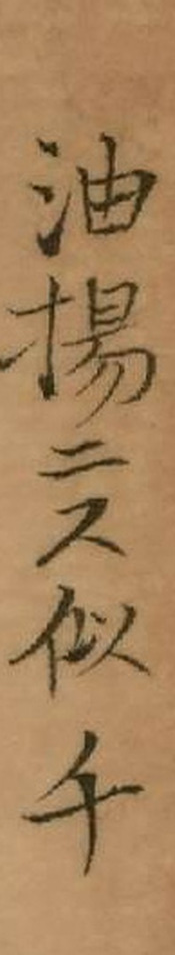油揚ニス似千
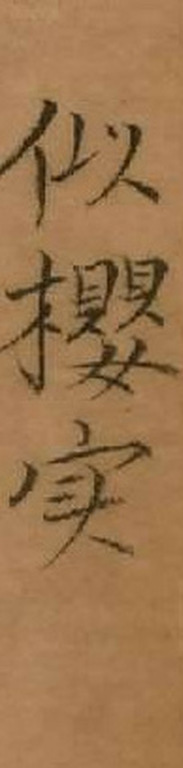似桜実
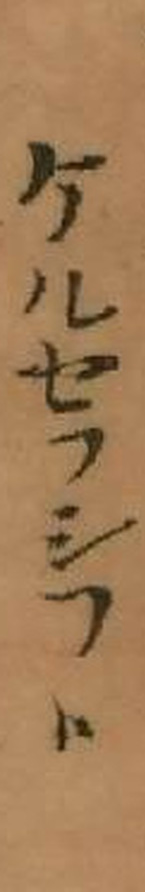ケルセフシフト
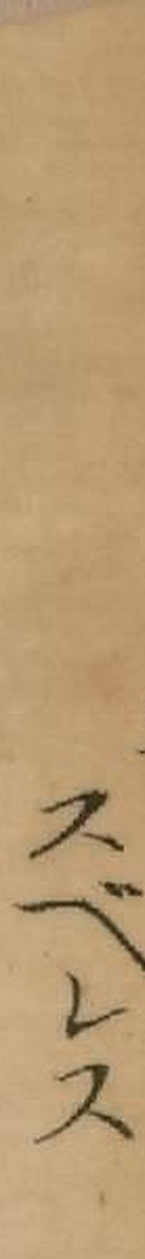スベレス
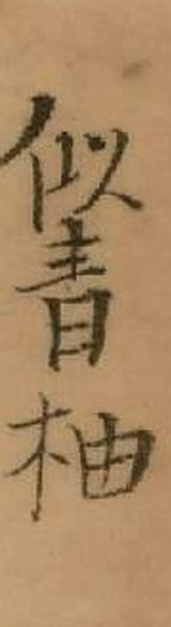似青柚
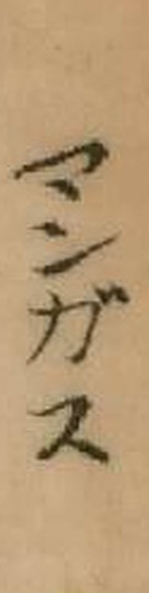マンガス
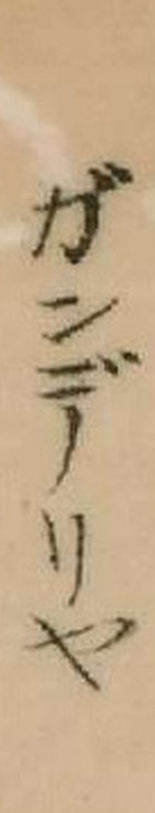ガンデリヤ
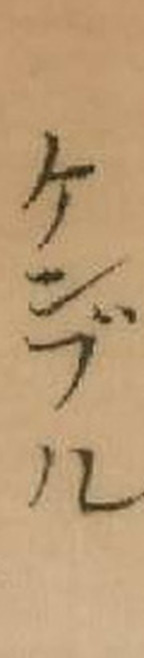ケンブル
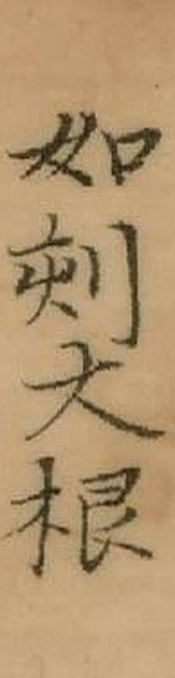如𠜇大根
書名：和蘭規式料理絵図
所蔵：神戸大学附属図書館 国文学研究資料館
